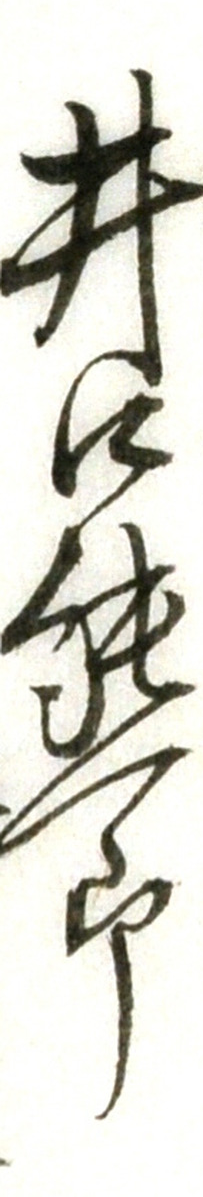井口純一郎

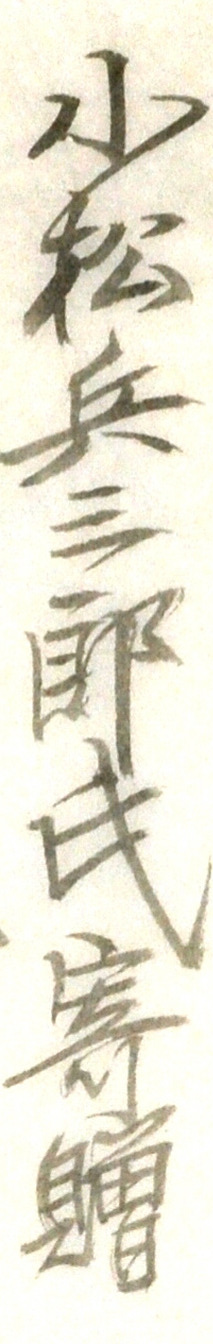小松兵三郎氏寄贈
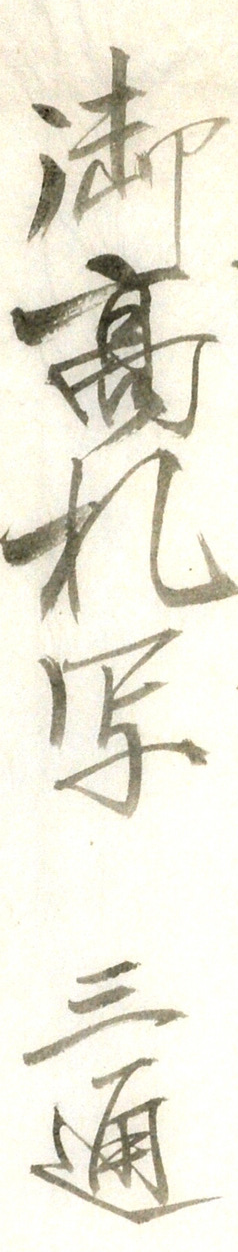御高札写三通

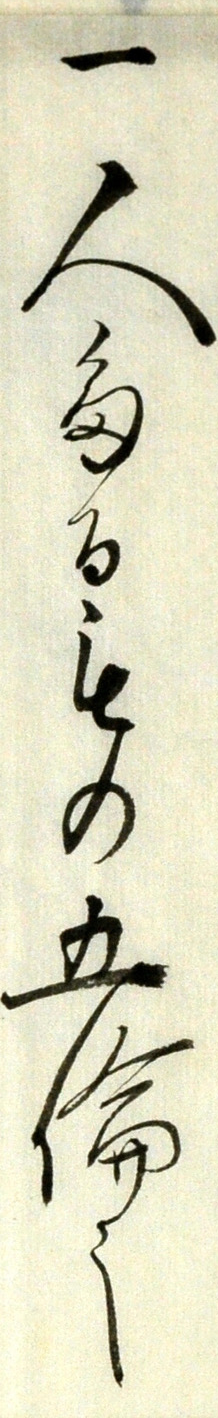一人たるもの五倫之
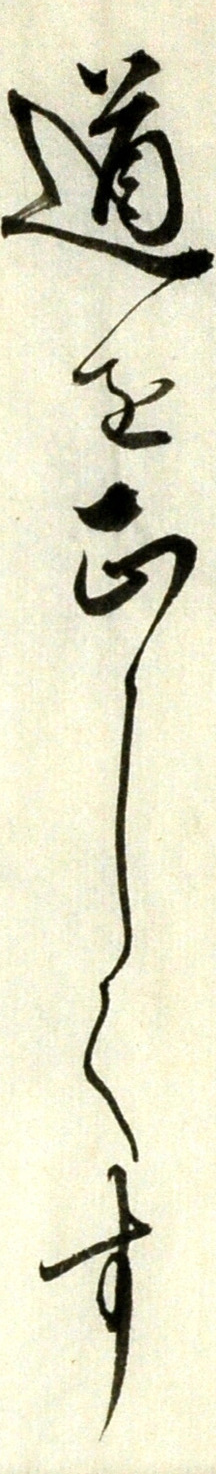道を正しくす
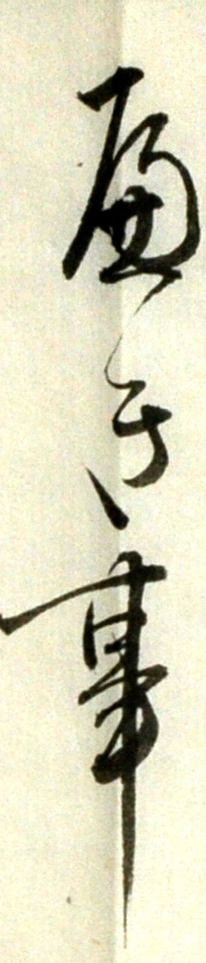べき事
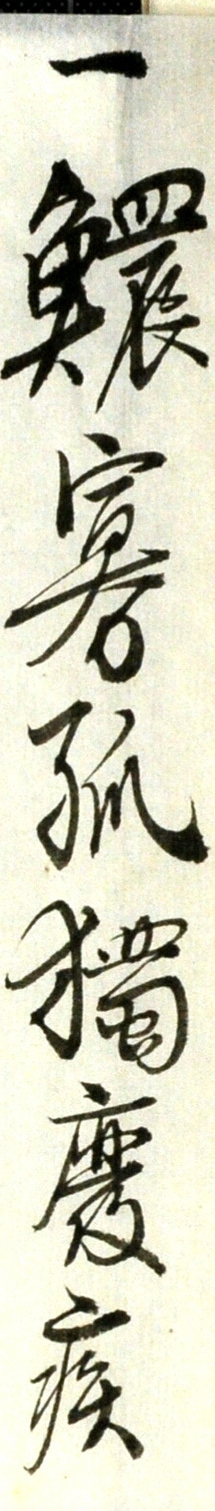一かん寡孤独慶疾
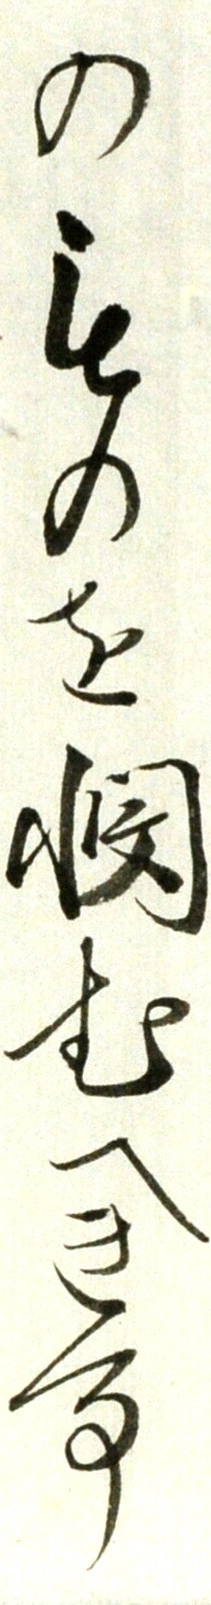のものを憫むべき事
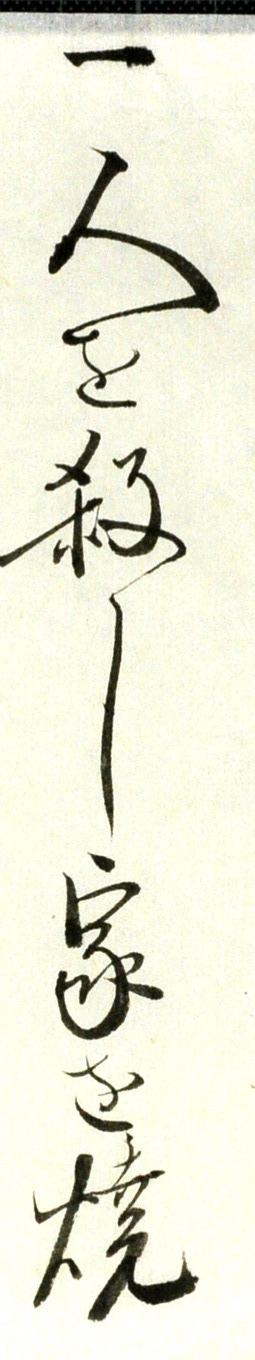一人を殺し家を焼
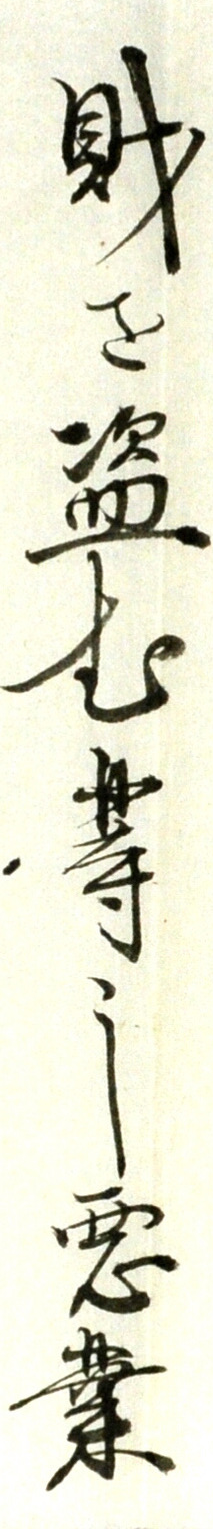財を盗む等之悪業
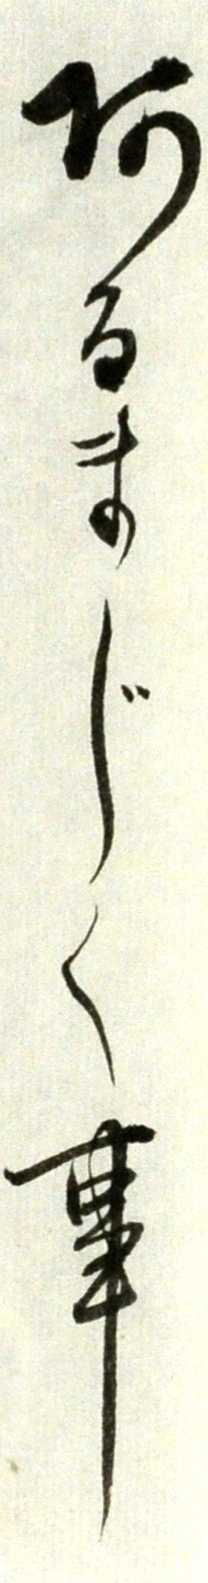あるまじく事
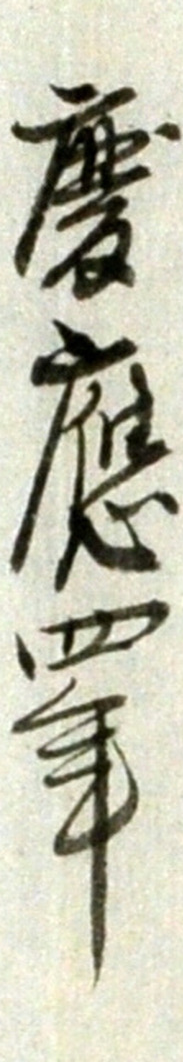慶應四年
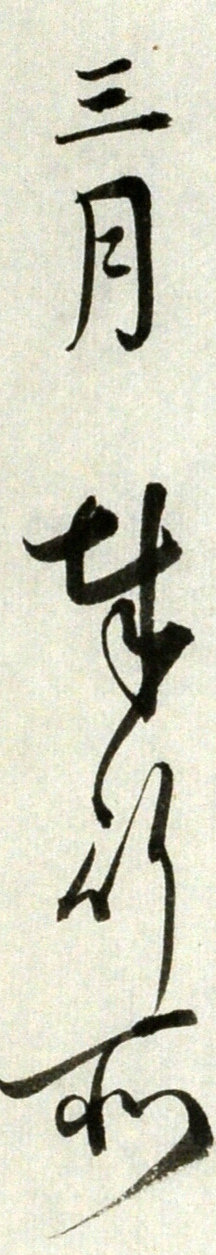三月奉行所

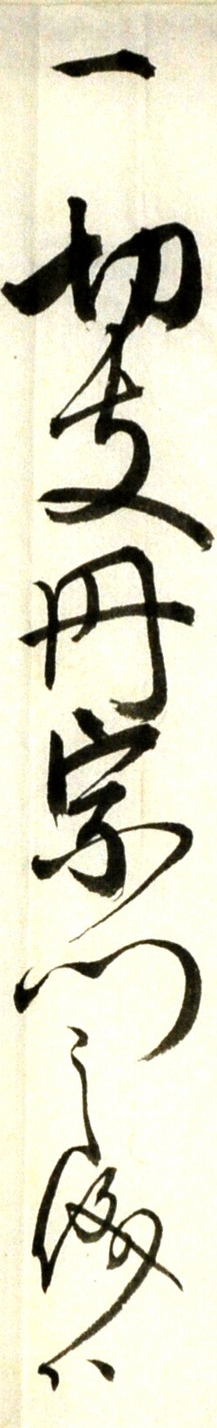一切支丹宗門之儀ハ
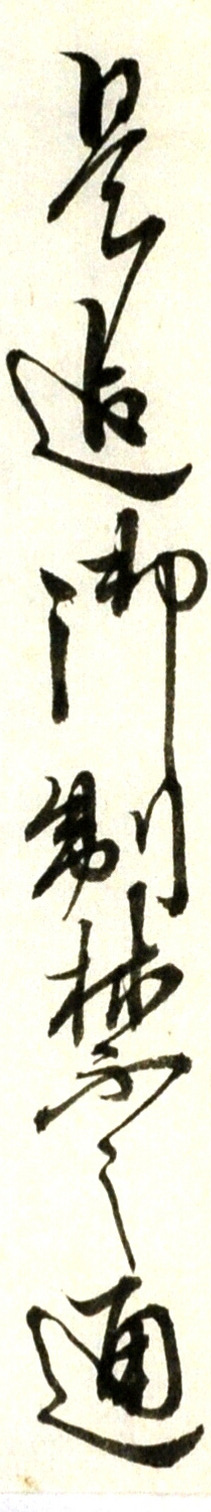是迄御制禁之通
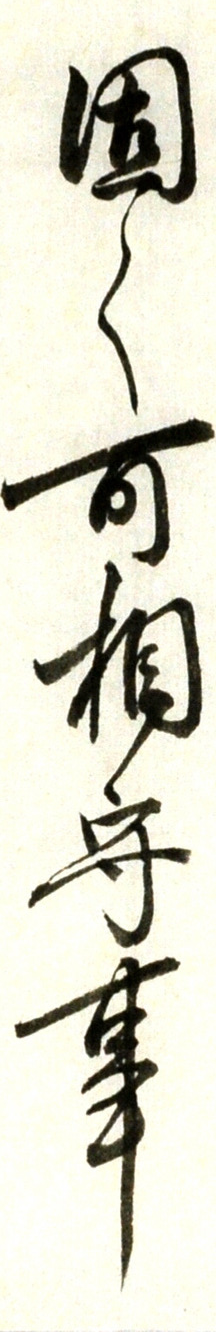固く可相守事
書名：御高札之写
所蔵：伊那市立高遠町図書館・合同会社AMANE
